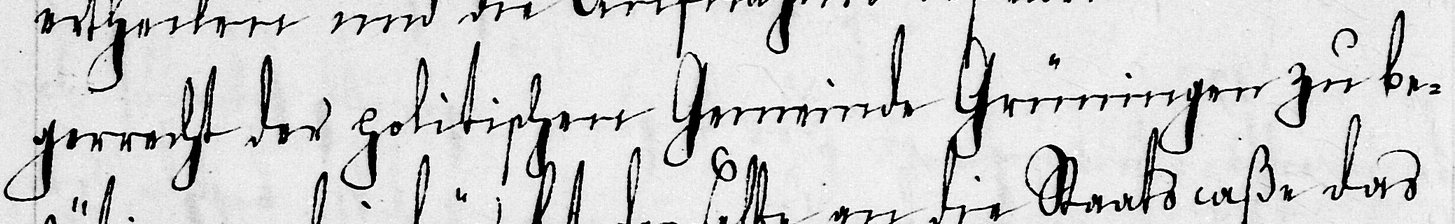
gerrecht der politischen Gemeinde Grüningen zu be¬
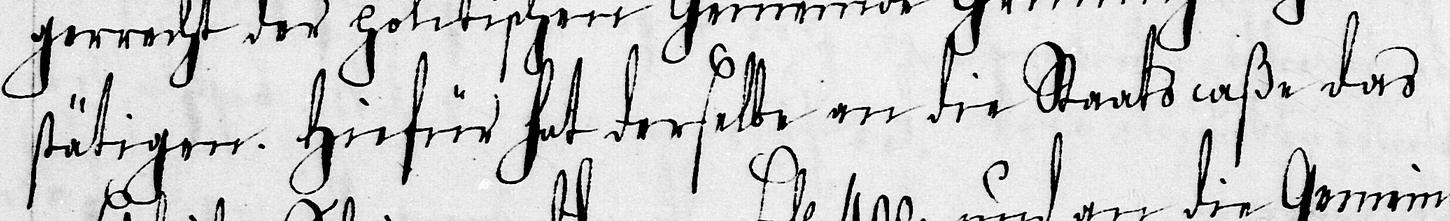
stätigen. Hiefür hat derselbe an die Staatscaßa das
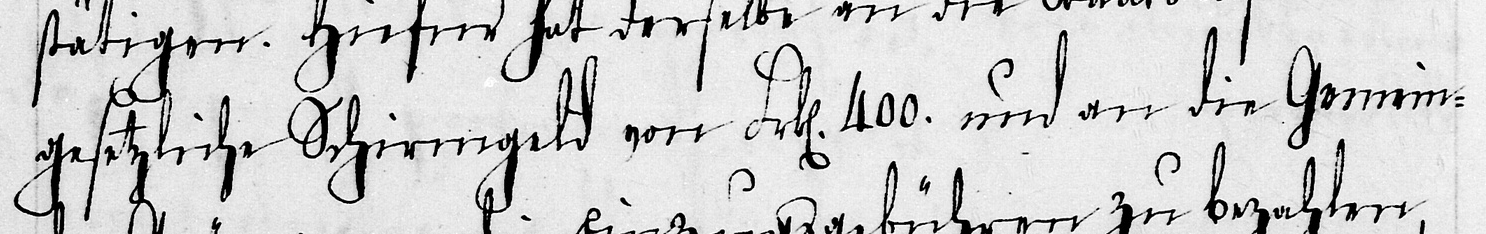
gesetzliche Schirmgeld von Frk[en]. 400. und an die Gemein¬
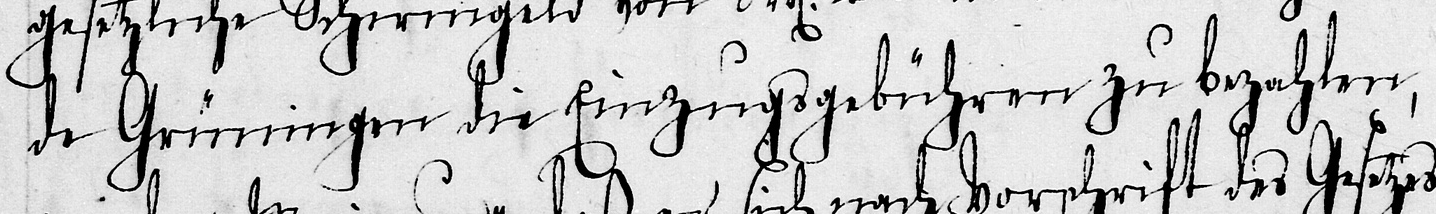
de Grüningen die Einzugsgebühren zu bezahlen,
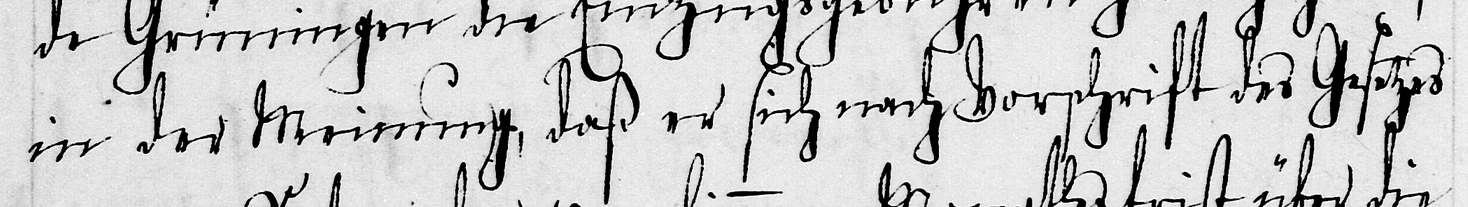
in der Meinung, daß er sich nach Vorschrift des Gesetz¬
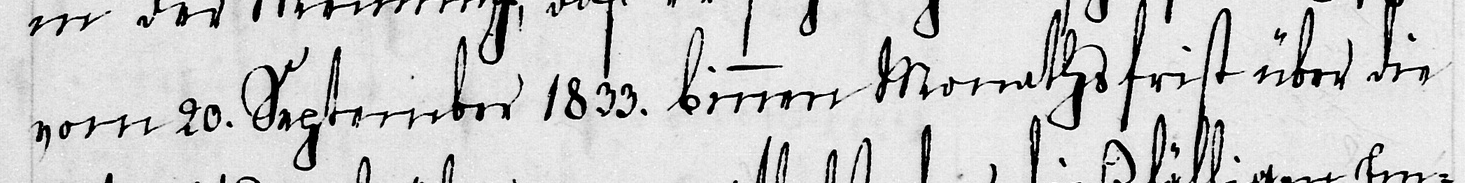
vom 20. September 1833. binnen Monathsfrist über die
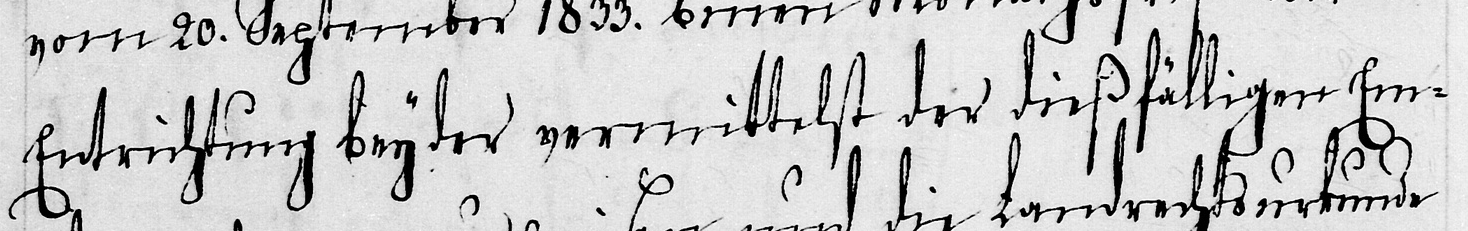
Entrichtung beyder vermittelst der dießfälligen Em¬
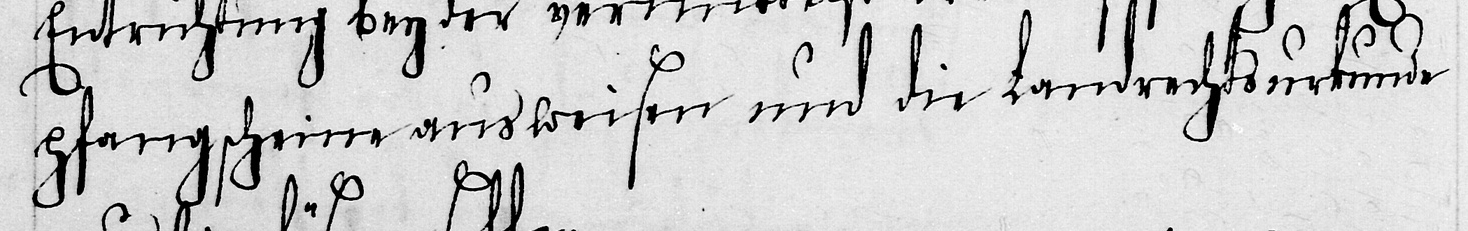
pfangscheine ausweisen und die Landrechtsurkunde
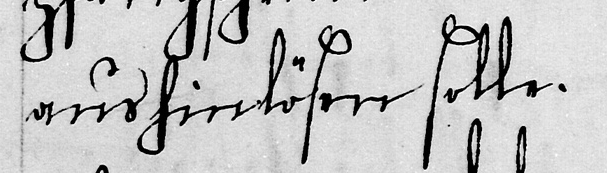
aushinlösen solle.
